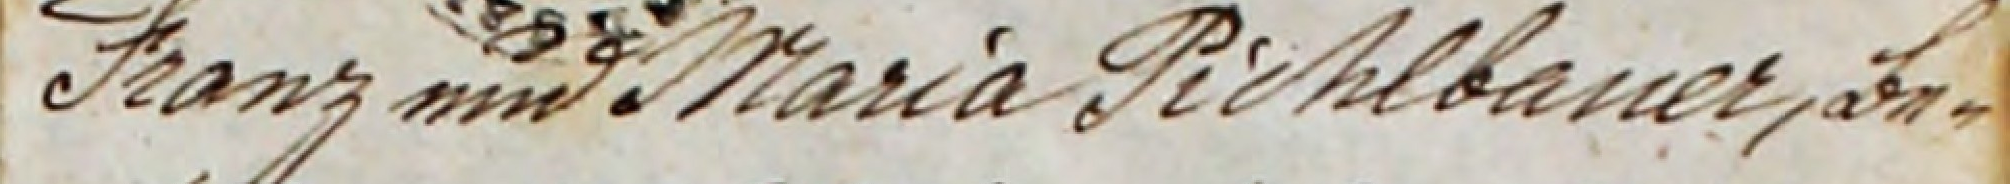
Franz und Maria Pichlbauer, Be=
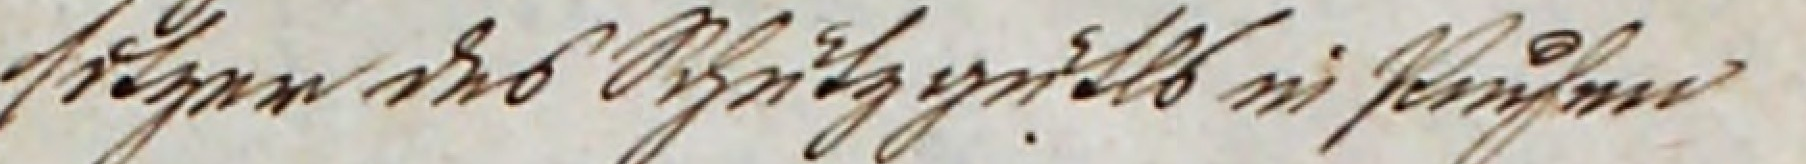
sitzer des Schutzgutls in Puchen
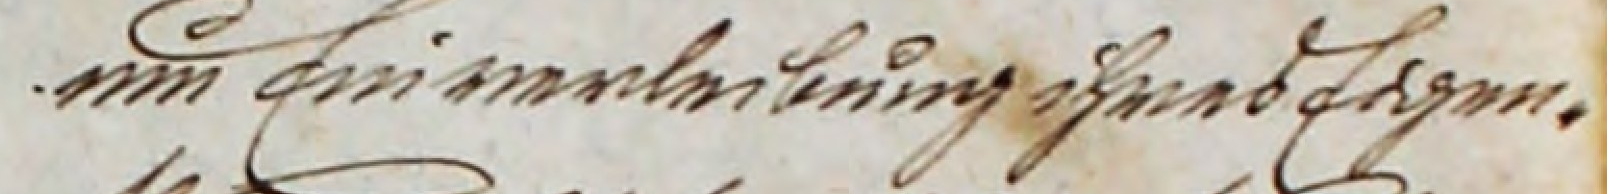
um Einverleibung ihres Eigen„
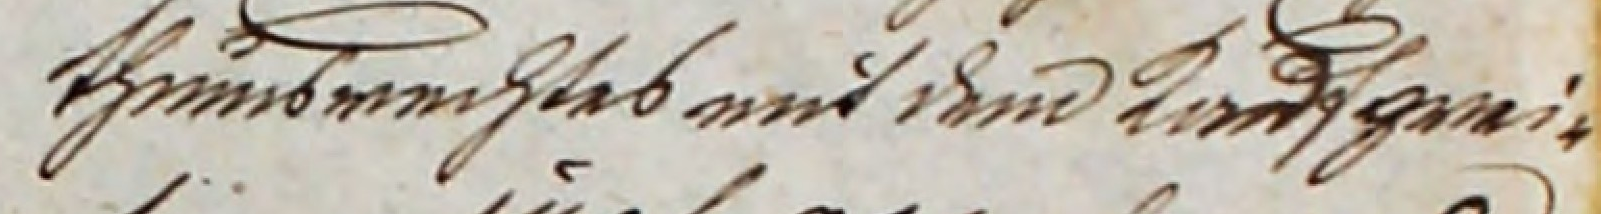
tumsrechtes mit dem Kaufprei„
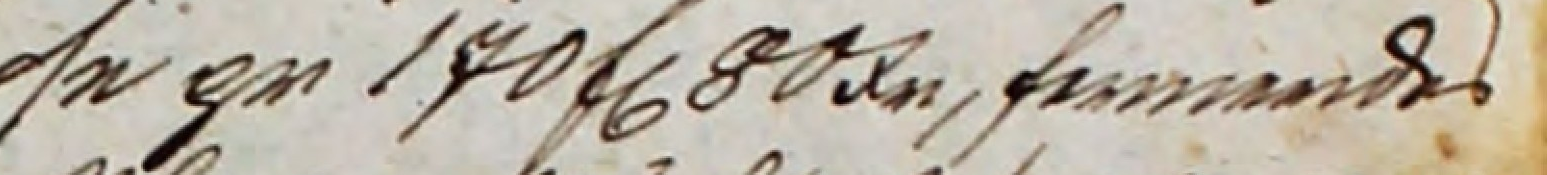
che pr 170 f. 80 kr, Fernandes
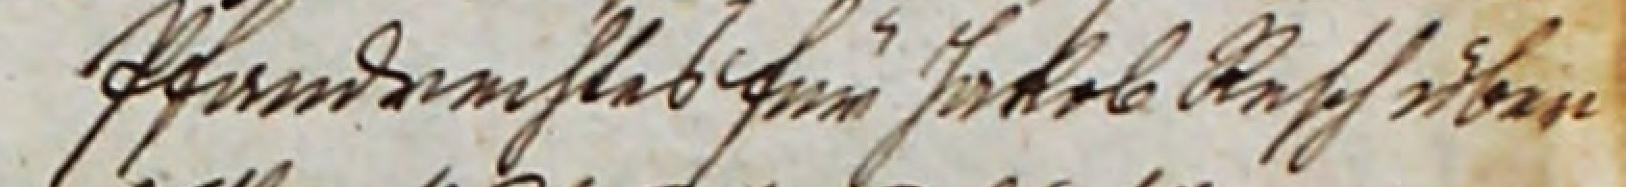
Pfandrechtes für Jakob Resch über
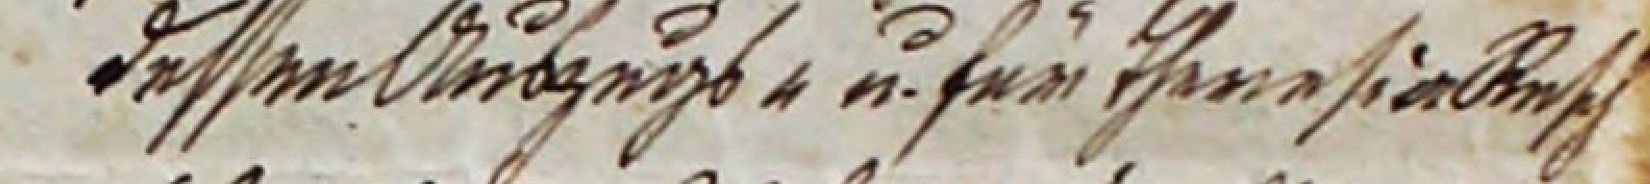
dessen Auszugs 4 u. für Theresia Resch
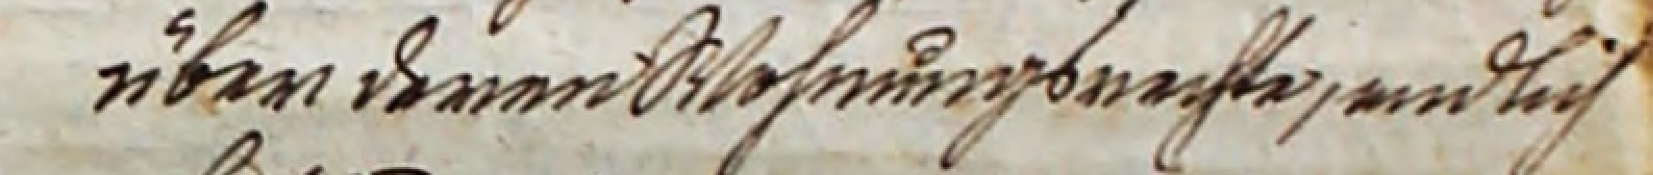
über deren Wohnungsrechte, endlich
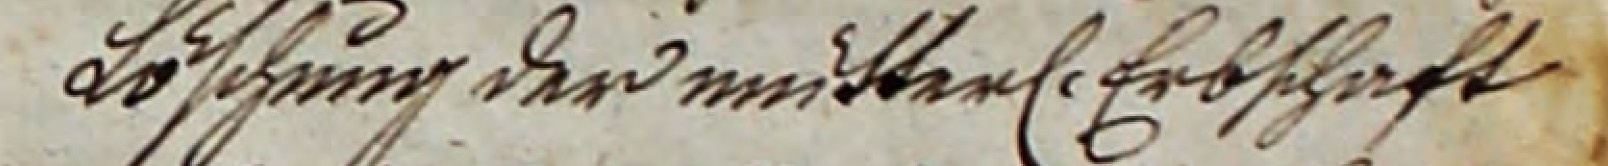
Löschung der mütterl. Erbschaft
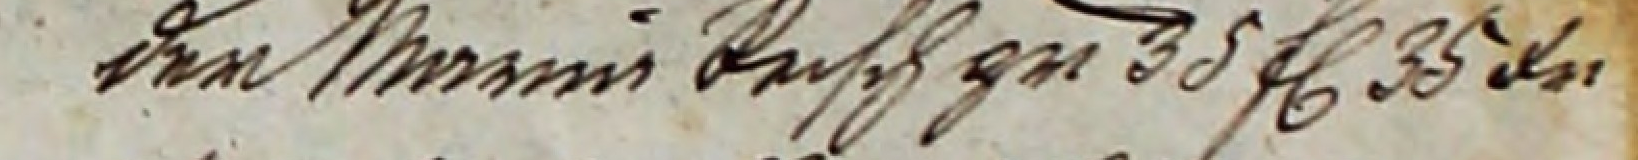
der Maria Resch pr 35 fl 35 kr
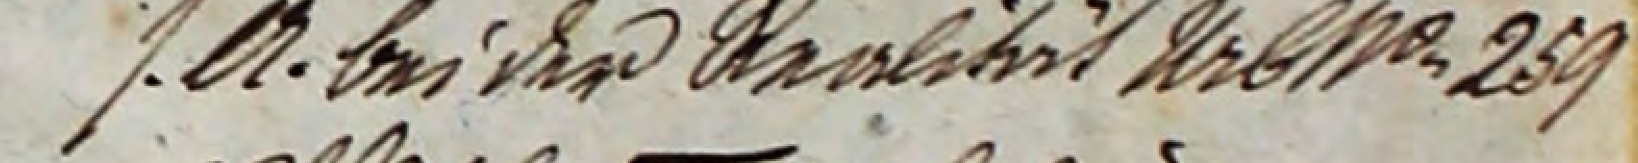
s.A. bei der Realität Urb No 259
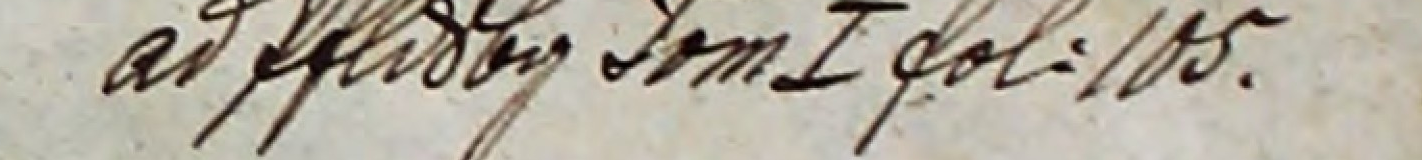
ad Pflddbg Tom I fol. 105.
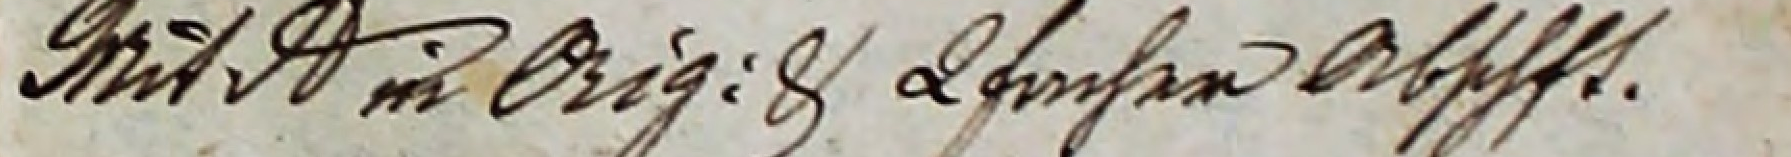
Gut A in Orig: & 2 fachen Abschft.
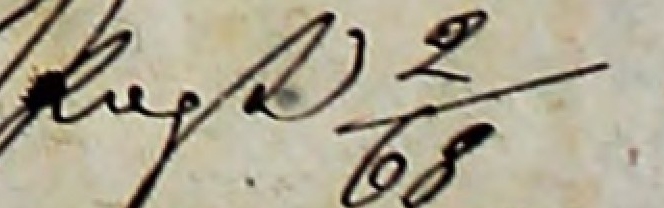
Past 2/68
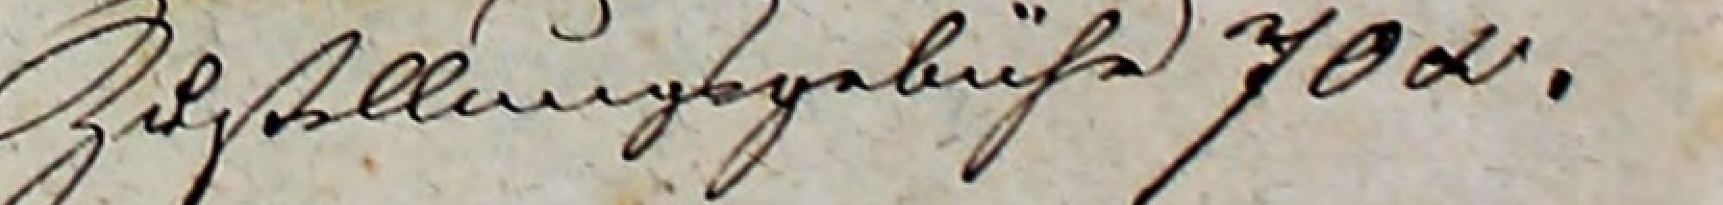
Zustellungsgebühr 702.
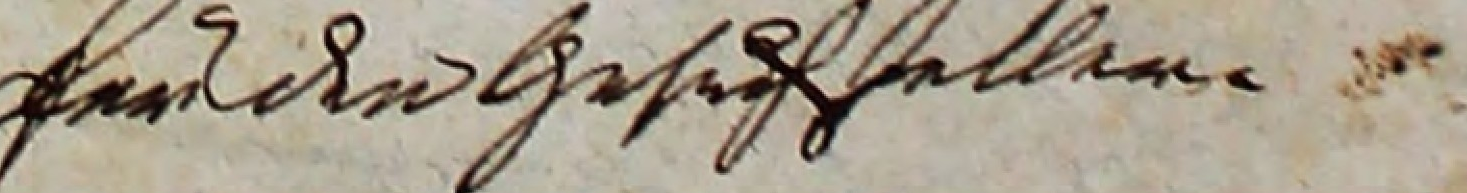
für den Gesuch Geller
